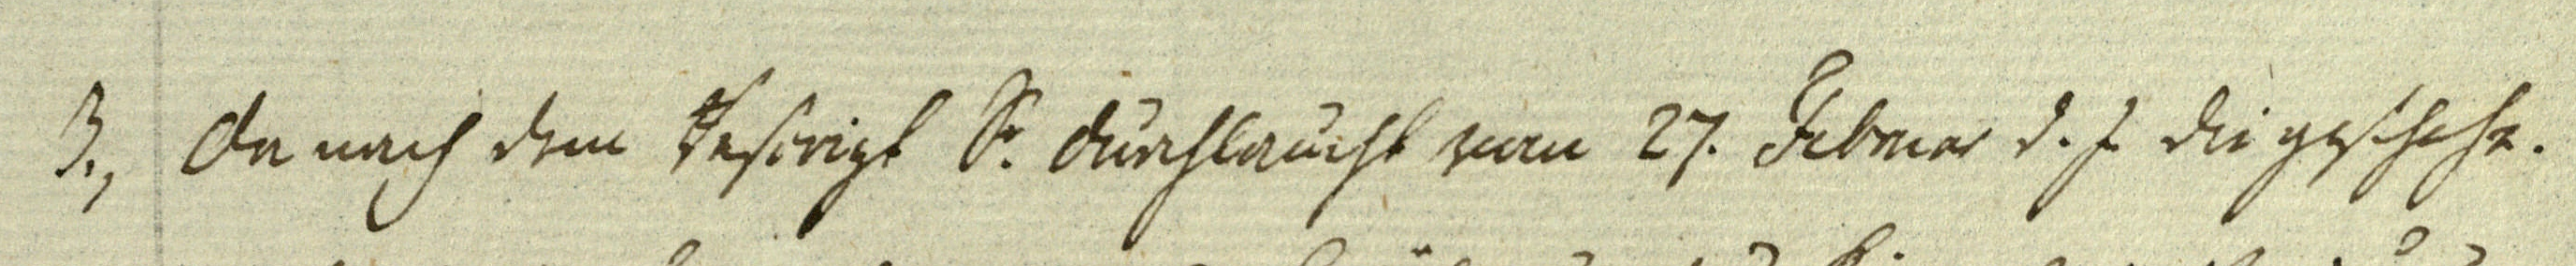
3., Da nach dem Rescript Sr. Durchlaucht vom 27. Febr. d. J. die geschehe¬
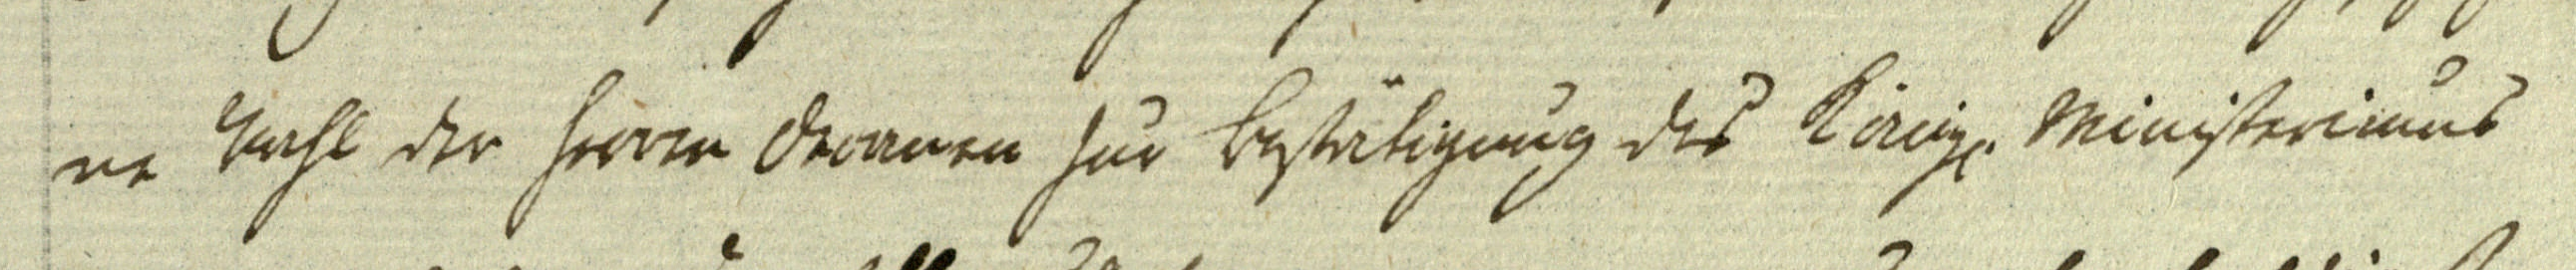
ne Wahl der Herren Decanen zur Bestätigung des Königl. Ministeriums
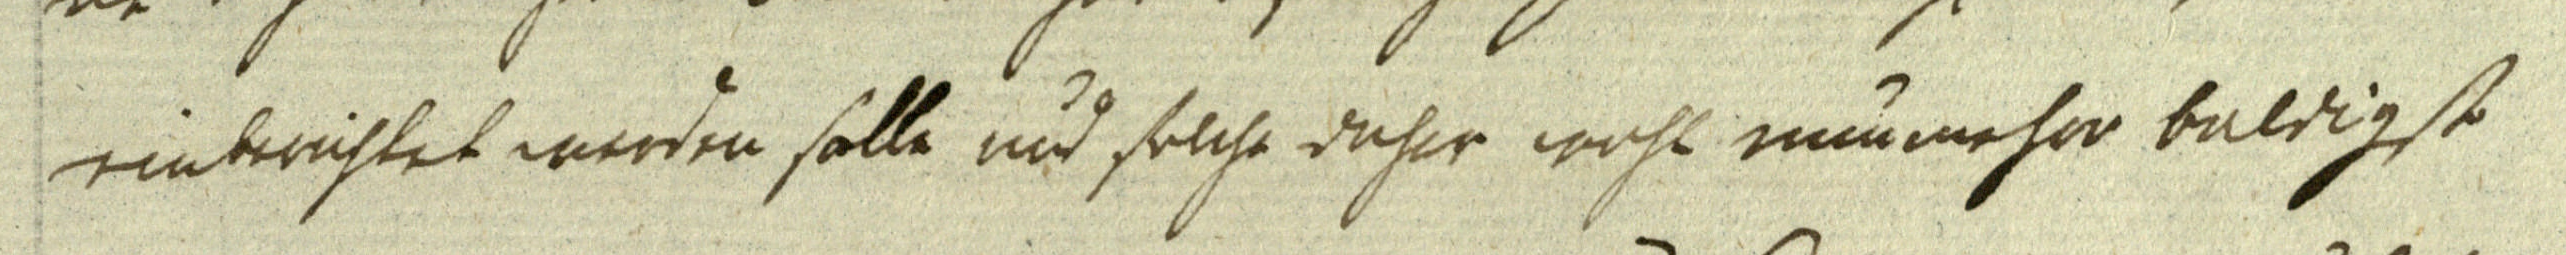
einberichtet werden solle und solche daher wohl nunmehro baldigst
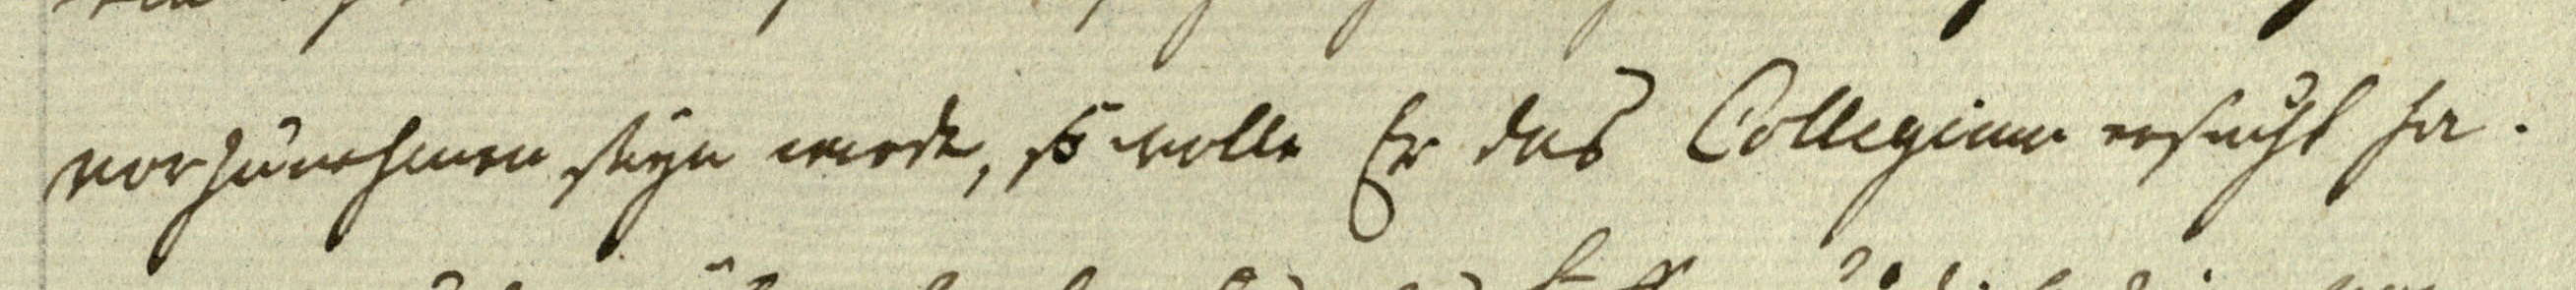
vorzunehmen seÿn werde, so wolle Er das Collegium ersucht ha¬
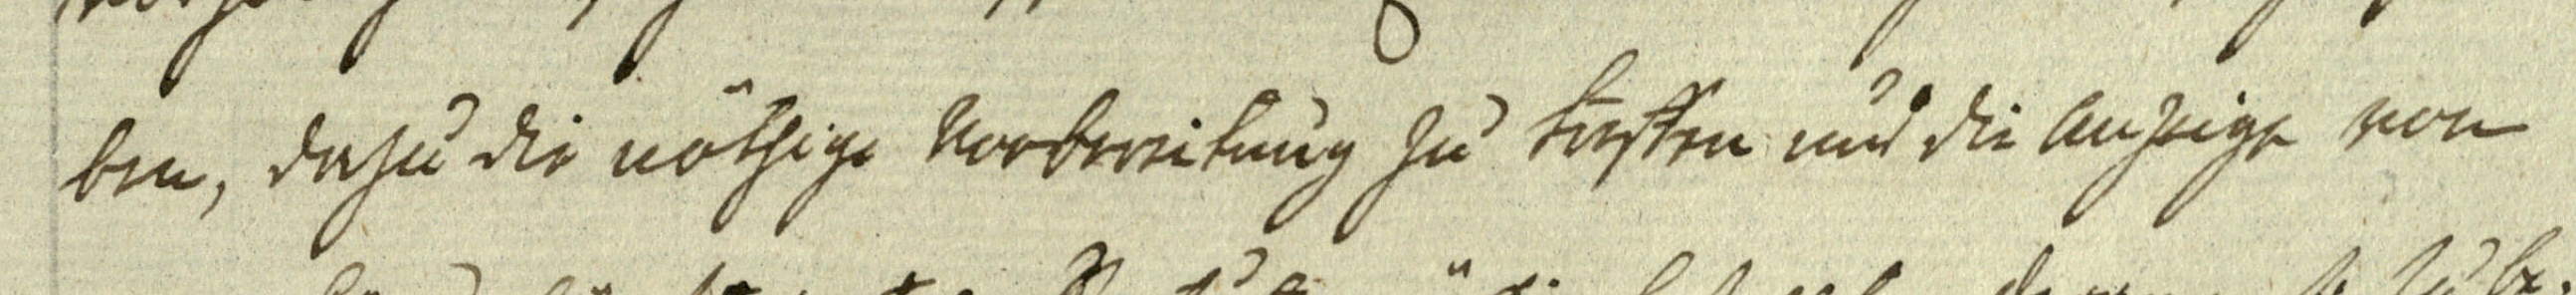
ben, dazu die nöthige Vorbereitung zu treffen und die Anzeige von
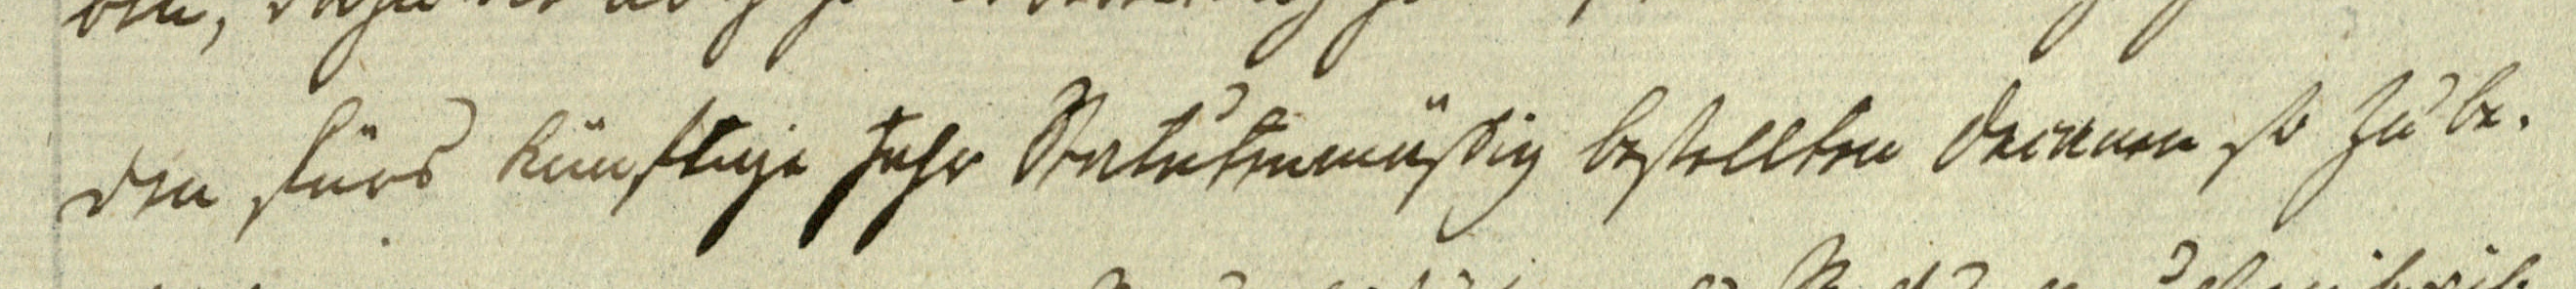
den fürs künftige Jahr Sratutenmässig bestellten Decanen so zu be¬
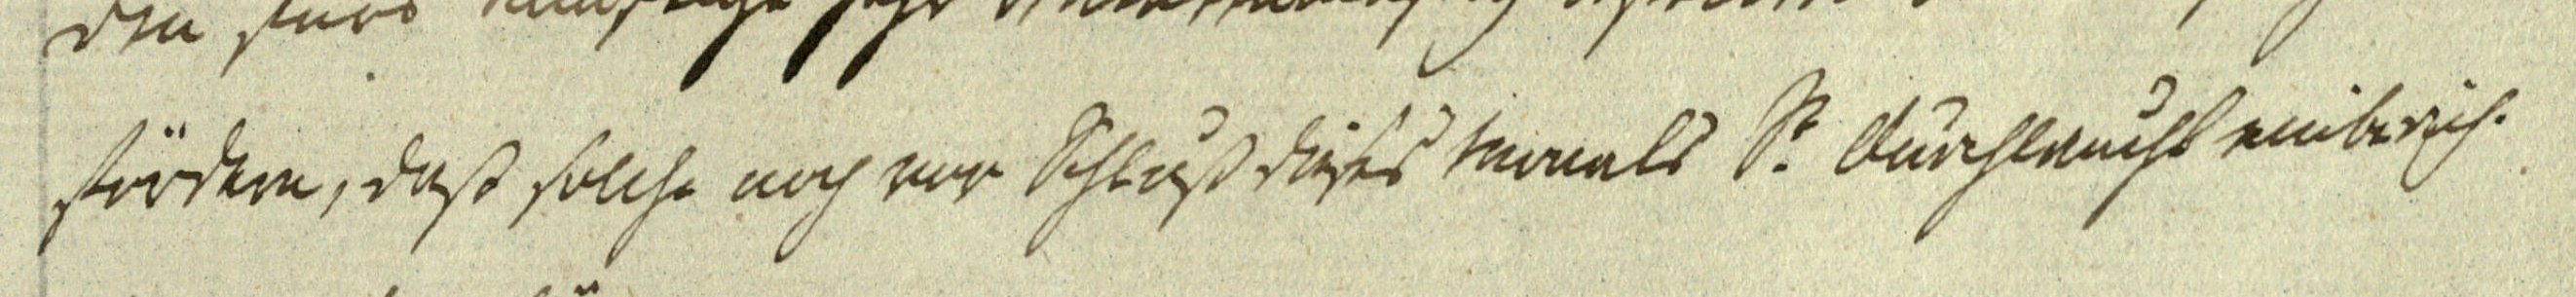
fördern, daß solche noch vor Schluß dieses Monats Sr Durchlaucht einberich¬
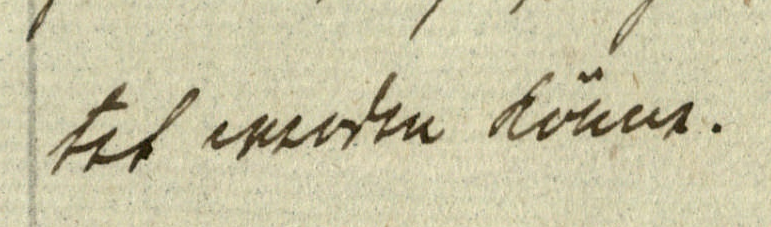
tet werden könne.
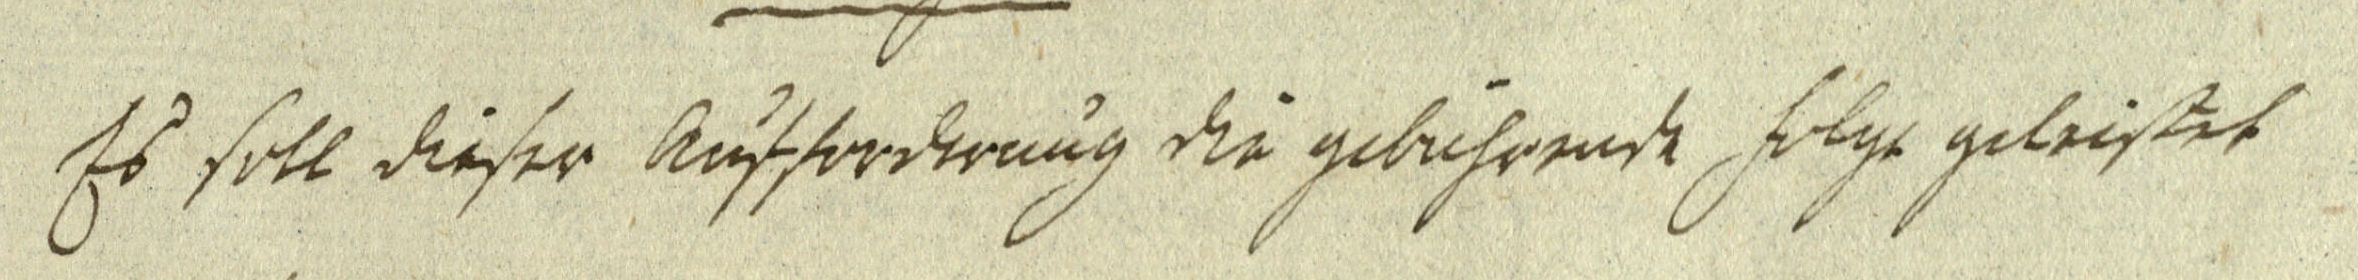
Es soll dieser Aufforderung die gebührende Folge geleistet
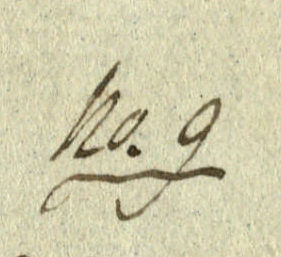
Nº 9.
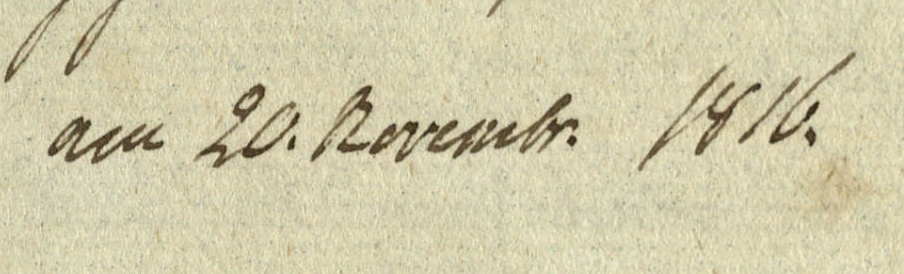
am 20. Novembr. 1816.
